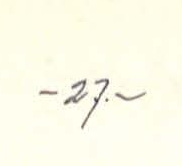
27.
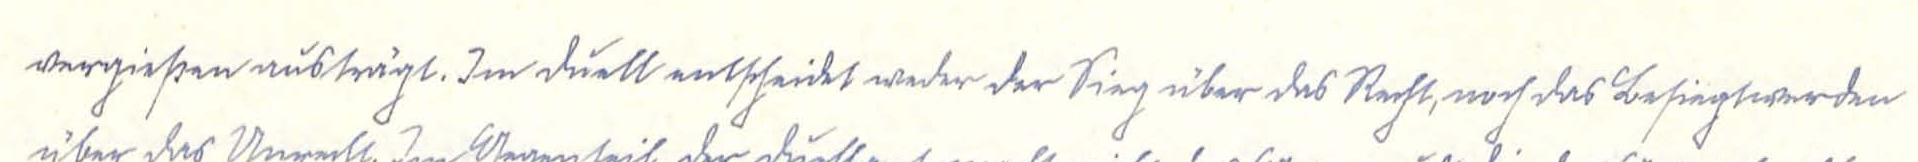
vergießen austrägt. Im Duell entscheidet weder der Sieg über das Recht, noch das Besiegtwerden
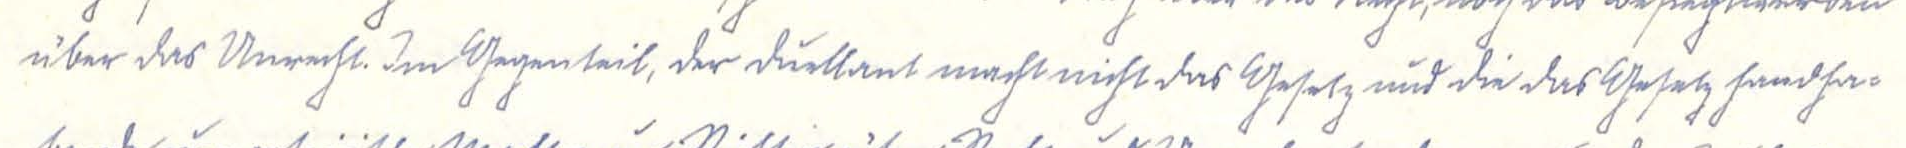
über das Unrecht. Im Gegenteil, der Duellant macht nicht das Gesetz und die das Gesetz handha-
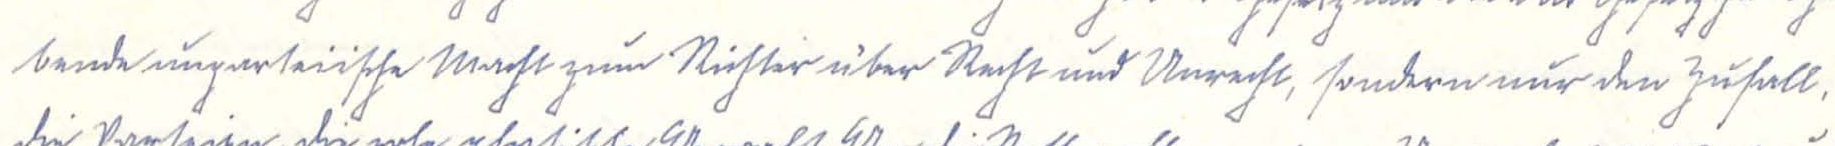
bende unparteiische Macht zum Richter über Recht und Unrecht, sondern nur den Zufall,
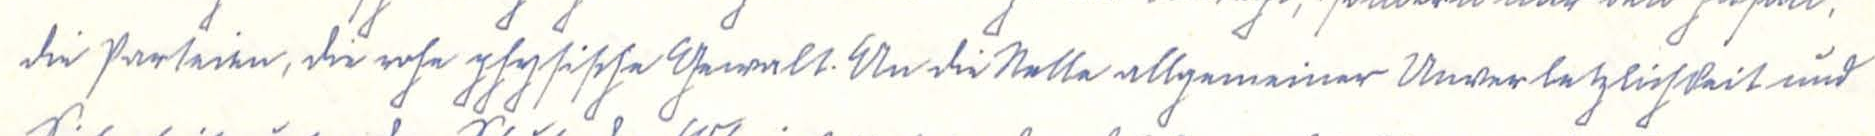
die Parteien, die rohe physische Gewalt. An die Stelle allgemeiner Unverletzlichkeit und
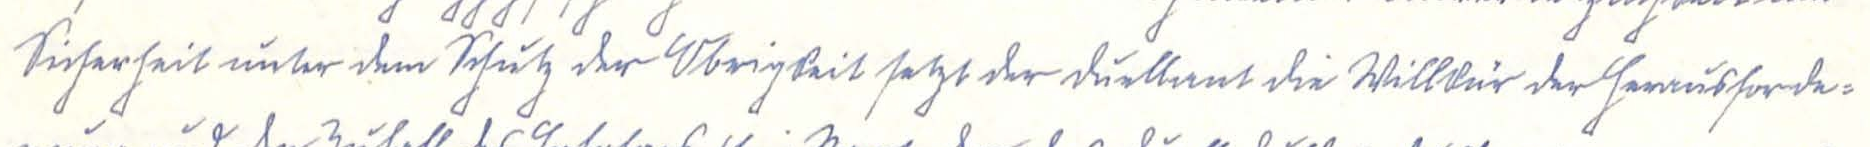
Sicherheit unter dem Schutz der Obrigkeit setzt der Duellant die Willkür der Herausforde-
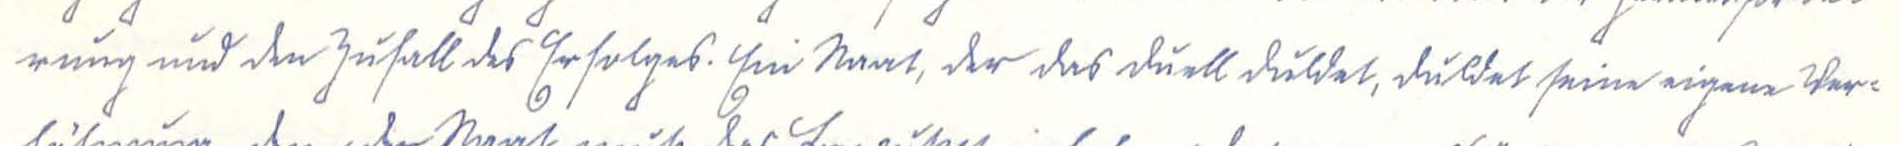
rung und den Zufall des Erfolges. Ein Staat, der das Duell duldet, duldet seine eigene Ver-
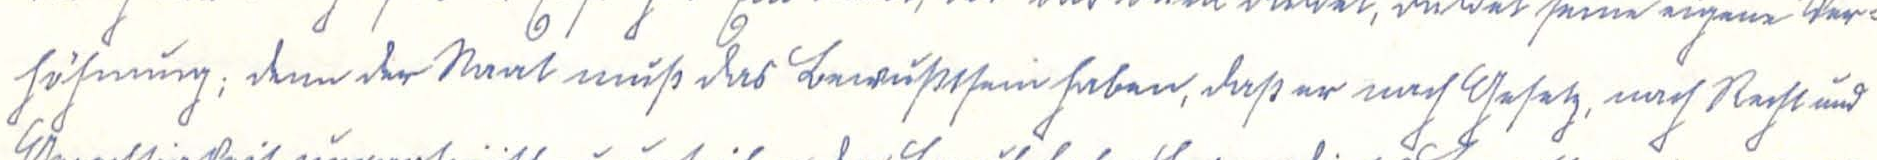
höhnung; denn der Staat muß das Bewusstsein haben, dass er nach Gesetz, nach Recht und
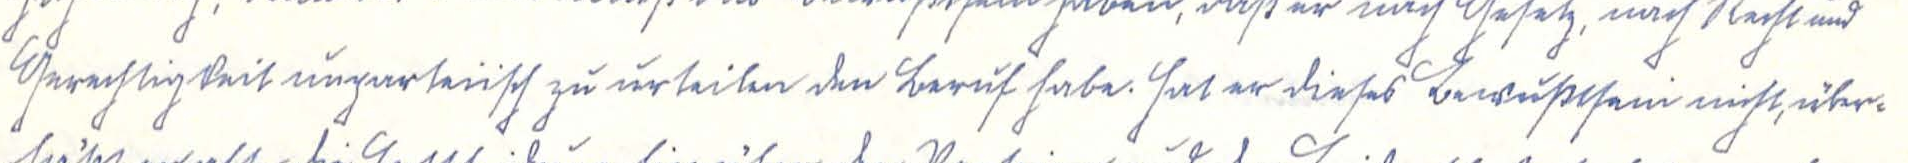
Gerechtigkeit unparteisch zu urteilen den Beruf habe. Hat er dieses Bewusstsein nicht, über-
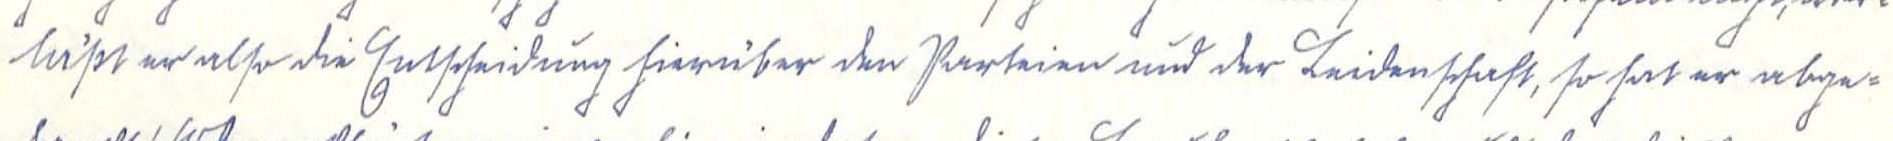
läßt er also die Entscheidung hierüber den Parteien und der Leidenschaft, so hat er abge-
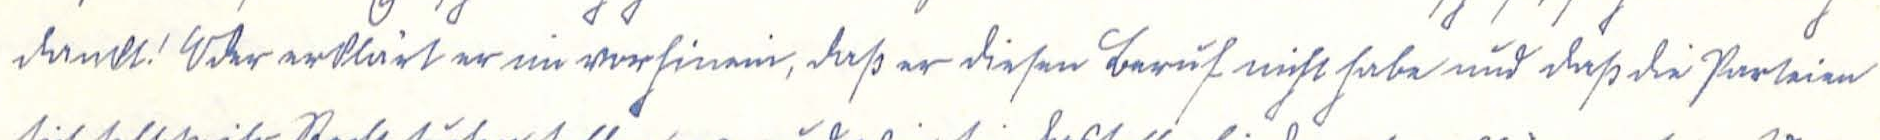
dankt! Oder erklärt er im vorhinein, dass er diesen Beruf nicht habe und daß die Parteien
